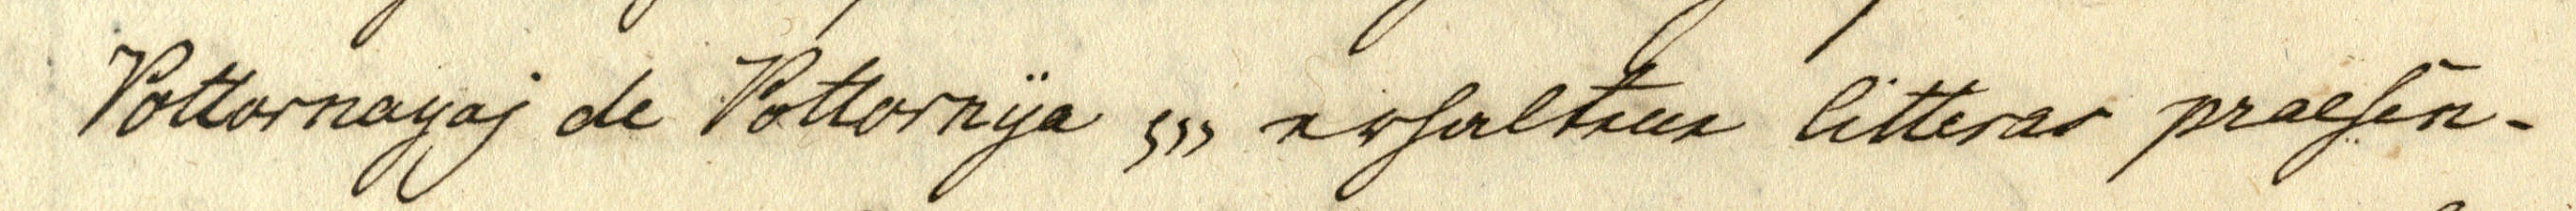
Pottornayaj de Pottonya etc. erhaltene litteras praesen-
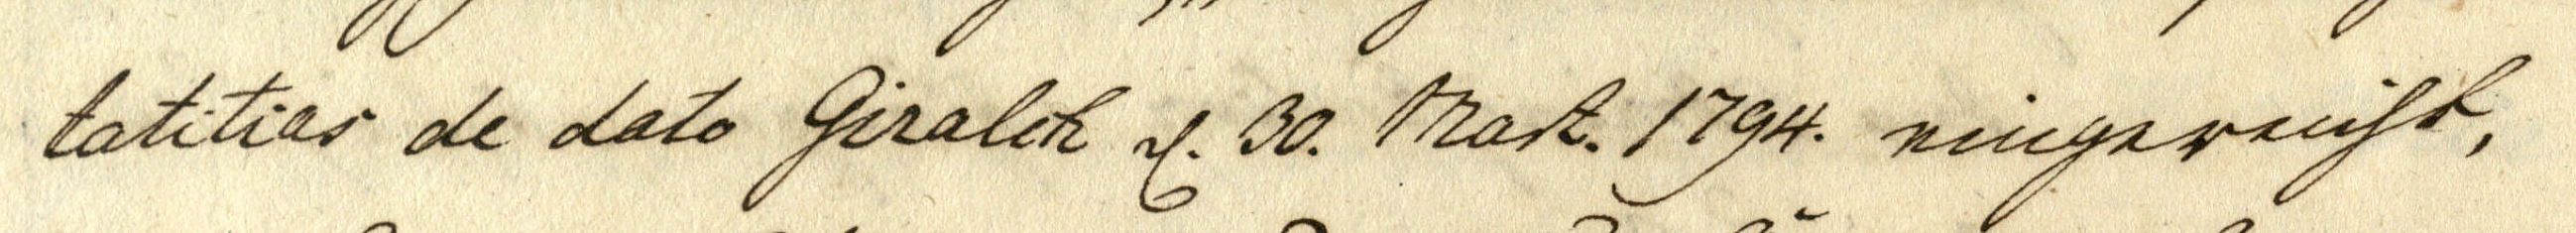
tatitias de dato Giralth d. 30. Mart. 1794 eingereicht,
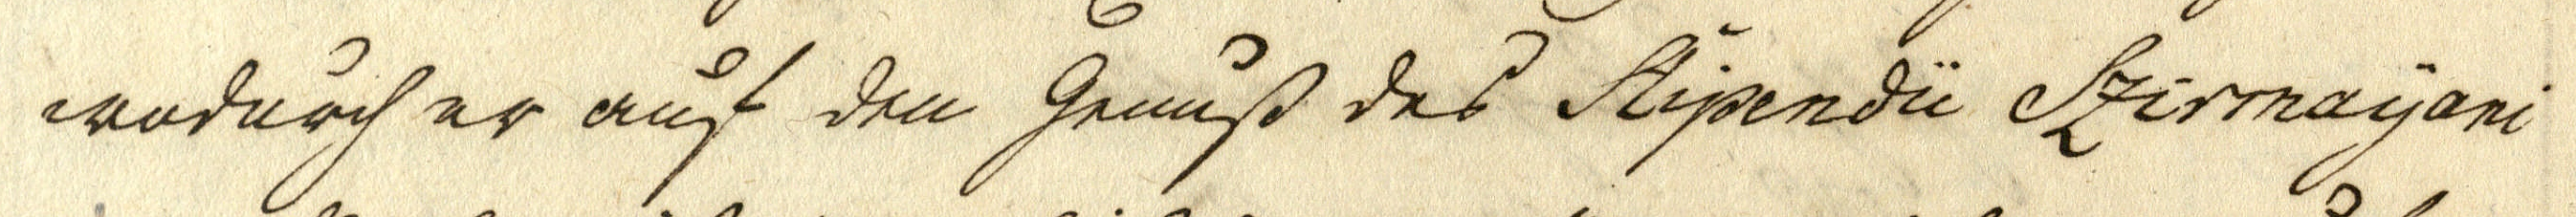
wodurch er auf den Genuß des Stipendii Szirmayani
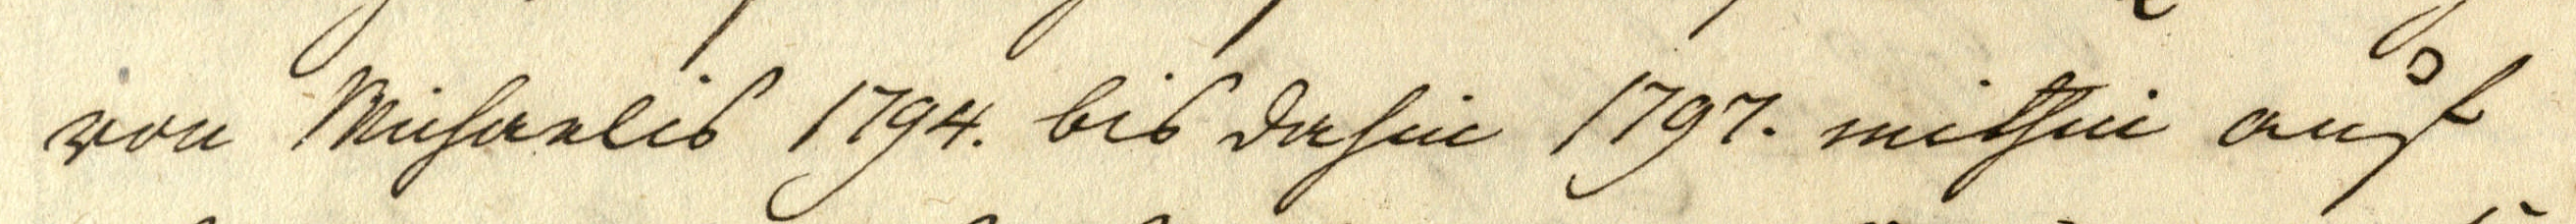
von Michaelis 1794. bis dahin 1797. mithin auf
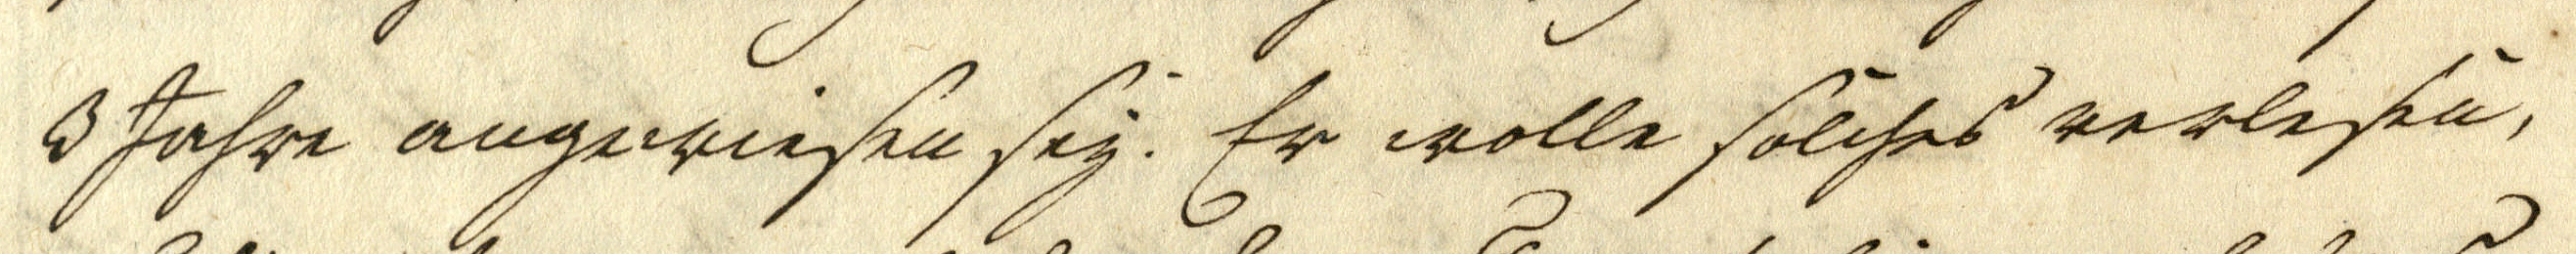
3 Jahre angewiesen sey. Er wolle solches verlesen,
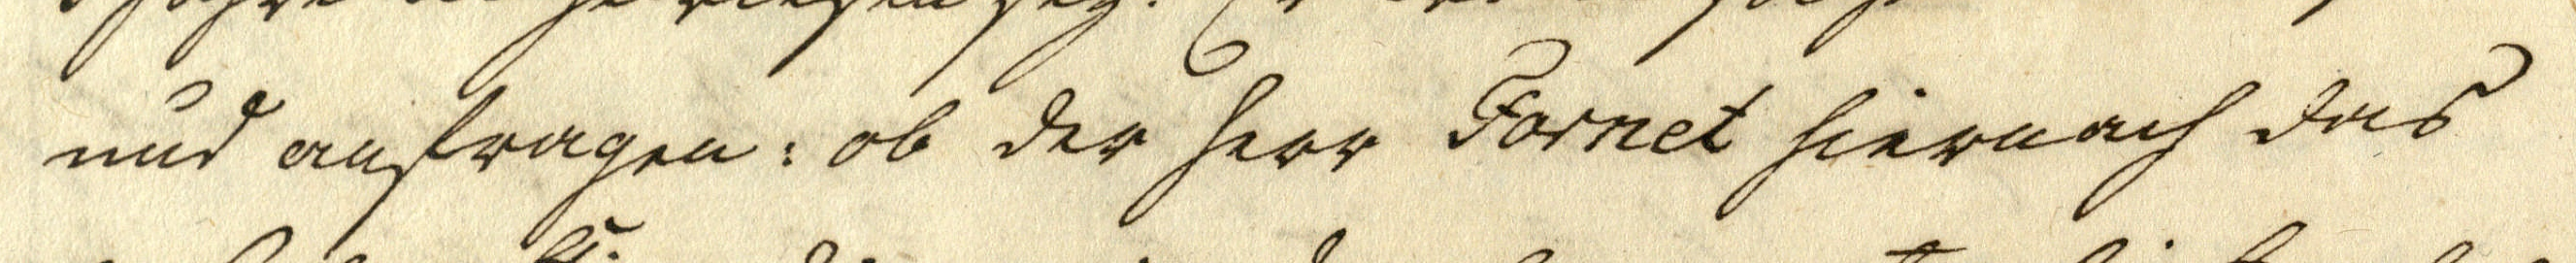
und anfragen: ob der Herr Fornet hiernach das
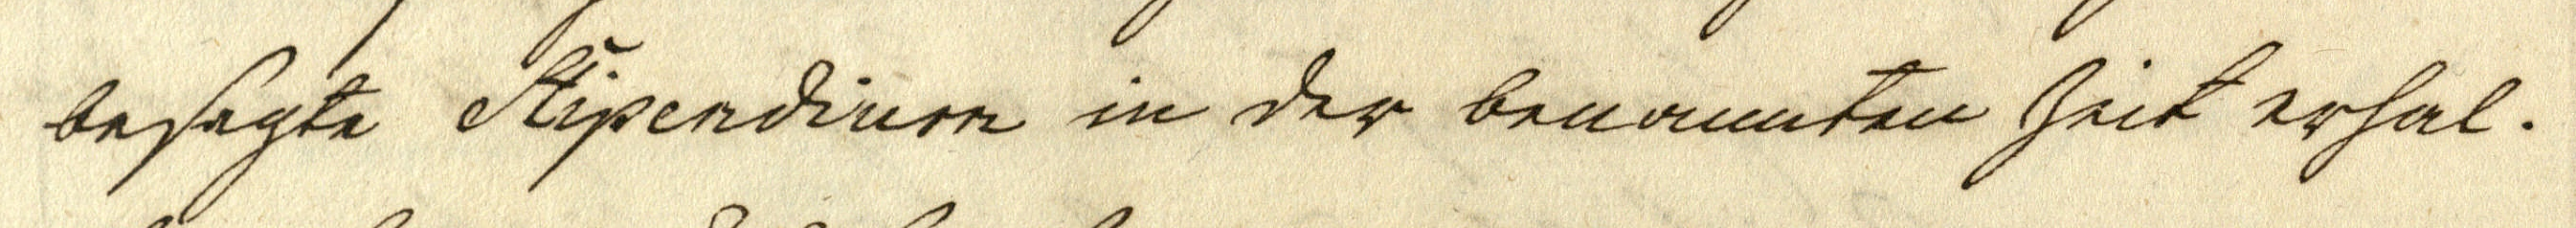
besagte Stipendium in der benannten Zeit erhal-
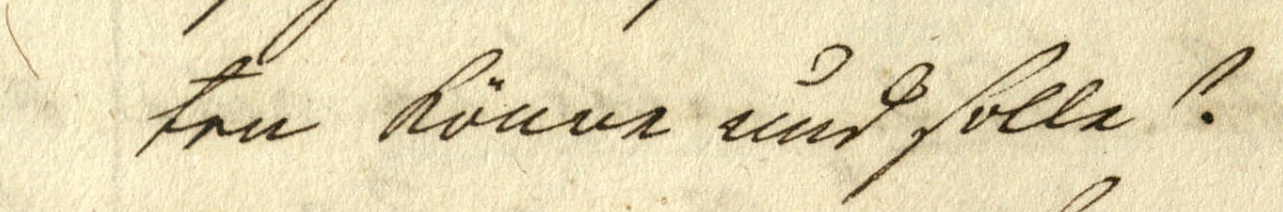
ten könne und solle?
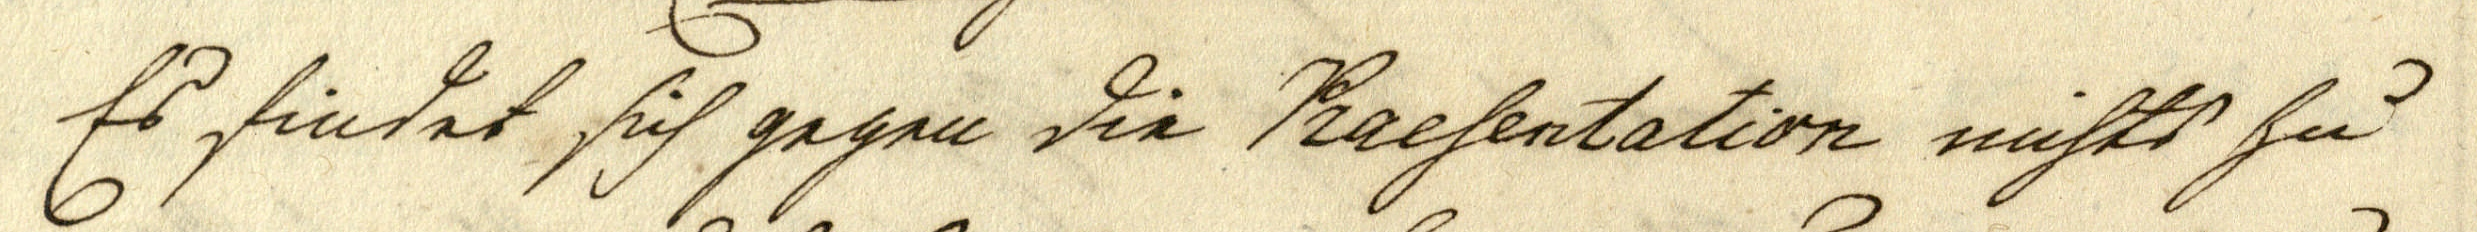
Es findet sich gegen die Praesentation nichts zu
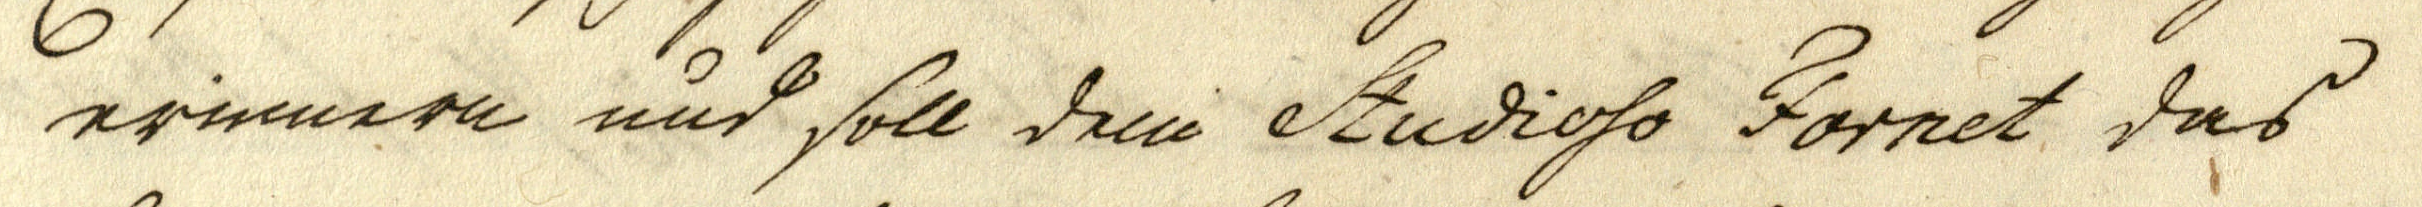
erinnern und soll dem Studioso Fornet das
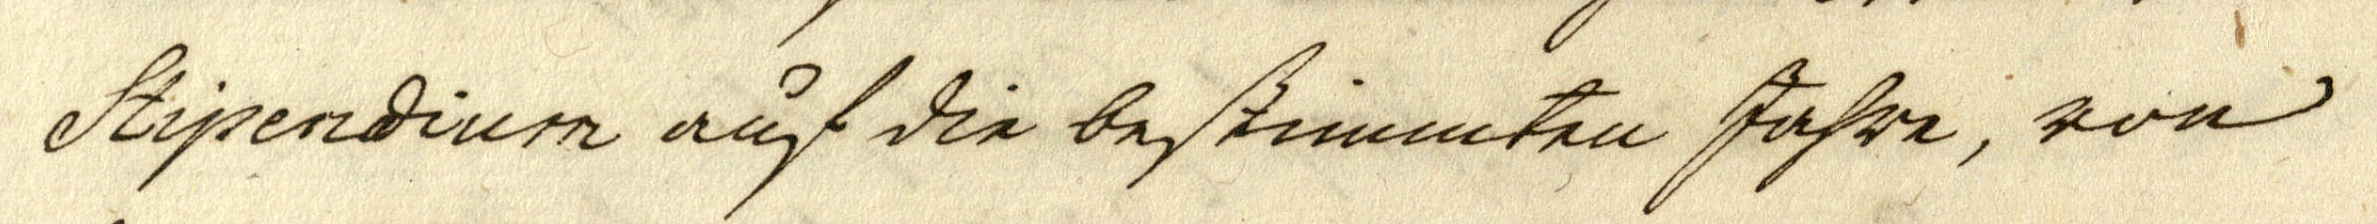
Stipendium auf die bestimmten Jahre, von
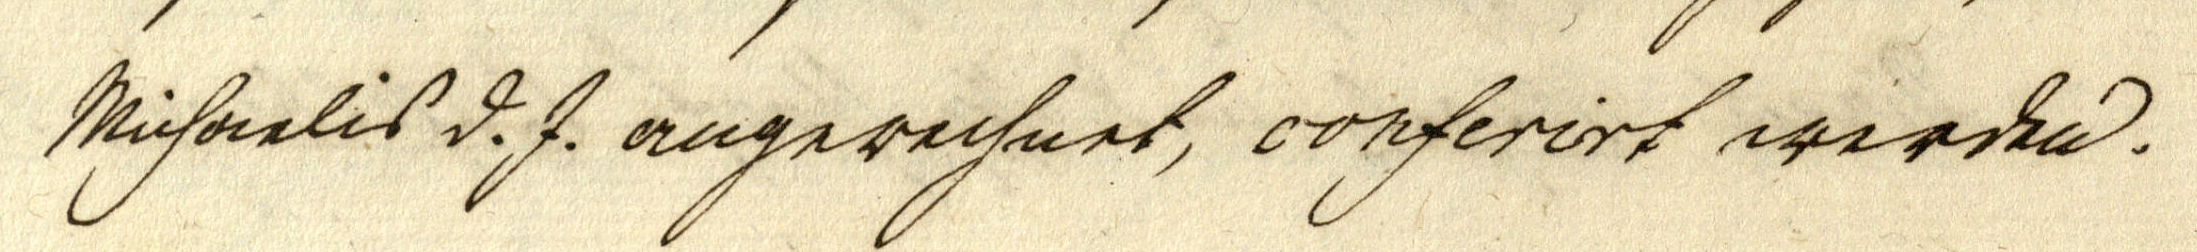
Michaelis d.J. angerechnet, conferirt werden.
